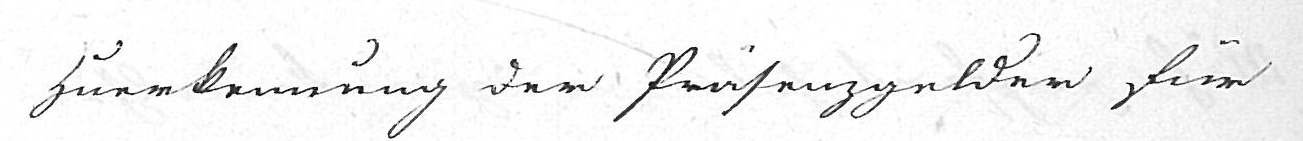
Zuerkennung der Präsenzgelder für
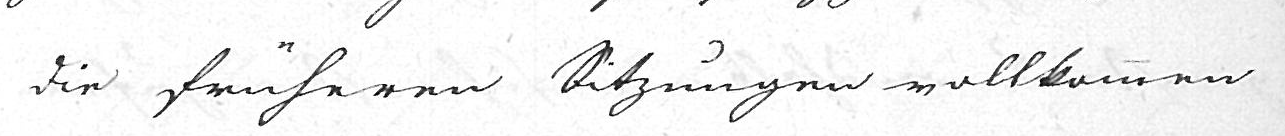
die früheren Sitzungen vollkommen
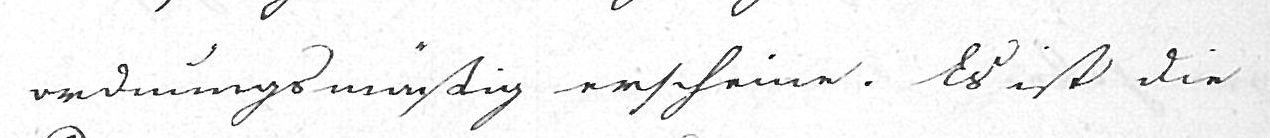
ordnungmäßig erscheine. Es ist die
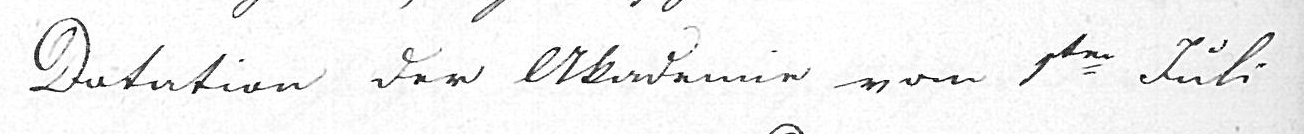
Dotation der Akademie von 1ten Juli
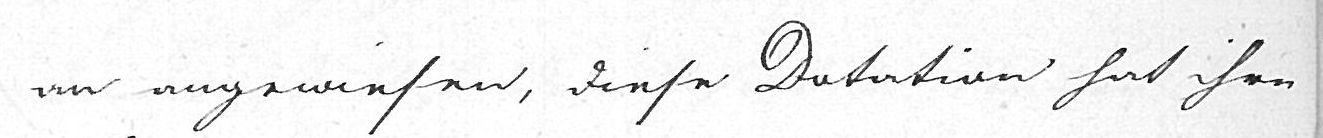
an angewiesen, diese Dotation hat ihre
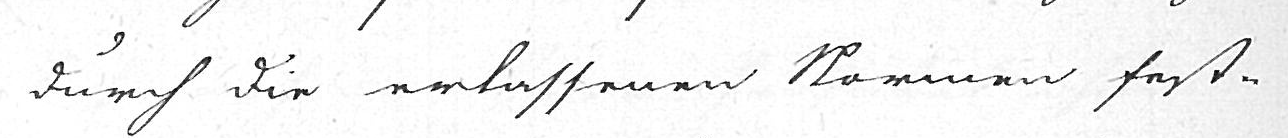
durch die erlassenen Normen fest-
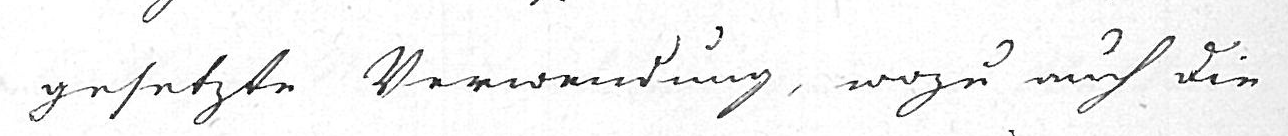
gesetzte Verwendung, wozu auch die
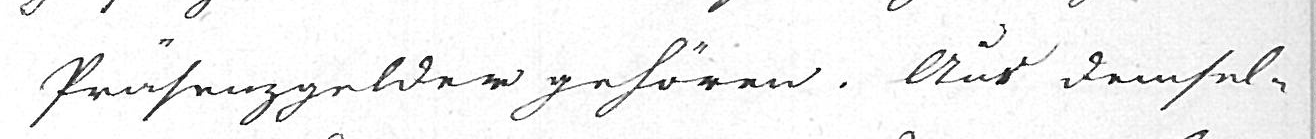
Präsenzgelder gehören. Aus demsel-
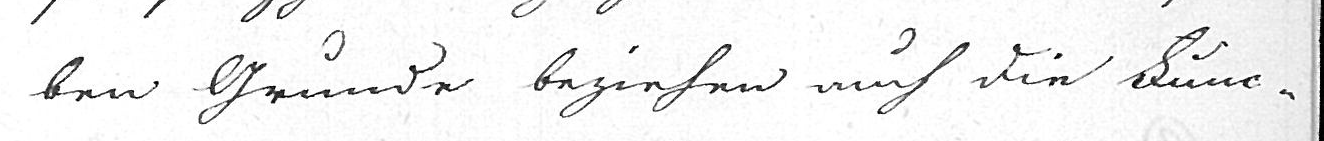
ben Grunde beziehen auch die Func-
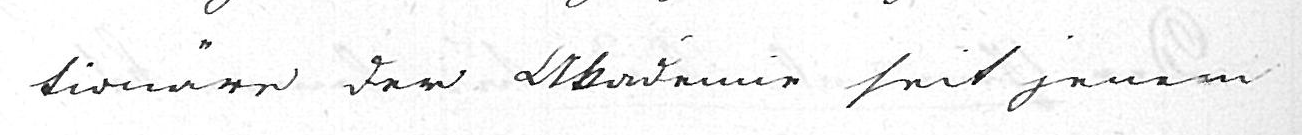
tionäre der Akademie seit jenem
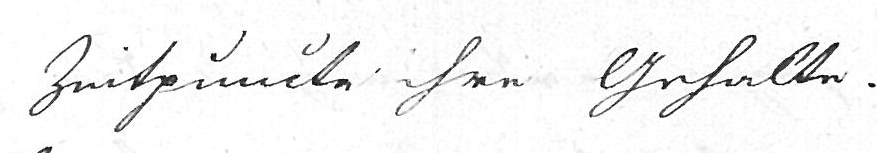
Zeitpuncte ihre Gehalte.
